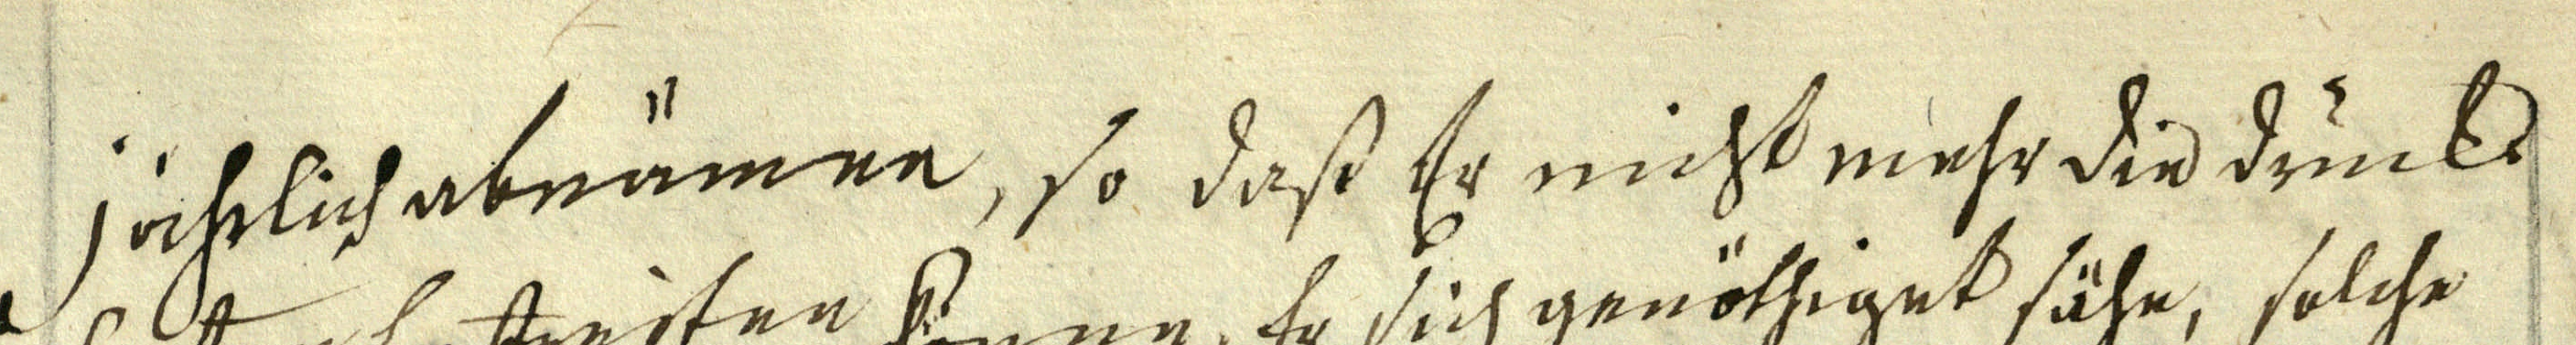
jährlich abnämen, so daß Er nicht mehr deie Druck¬
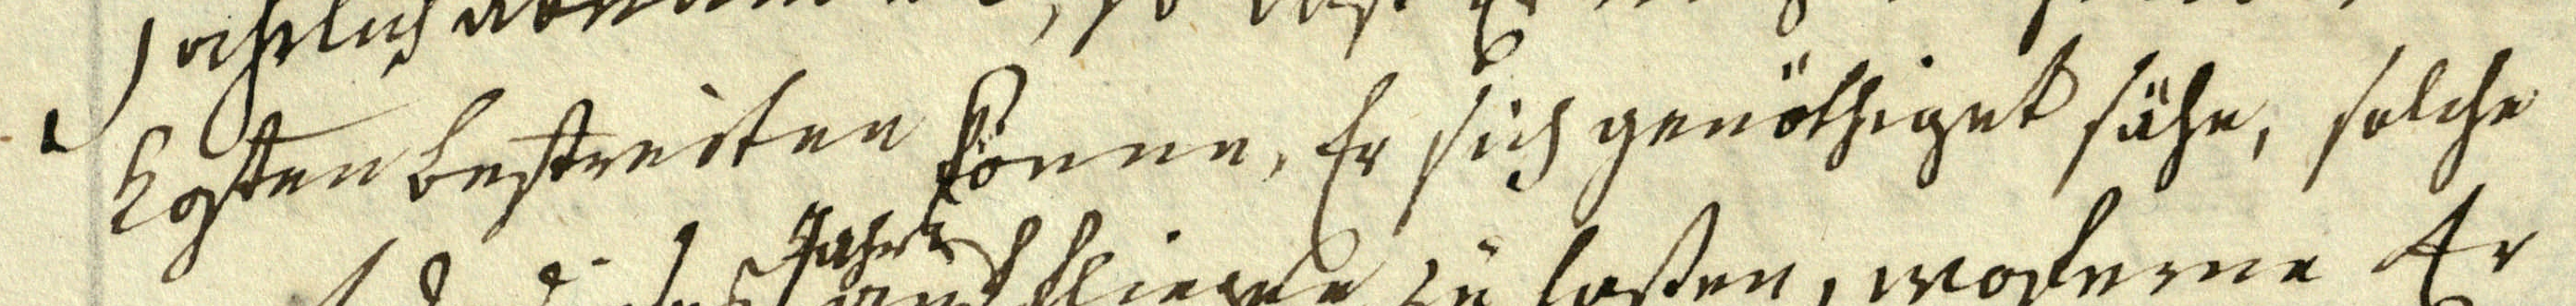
Kosten bestreiten könne, Er sich genöthiget sähe, solche
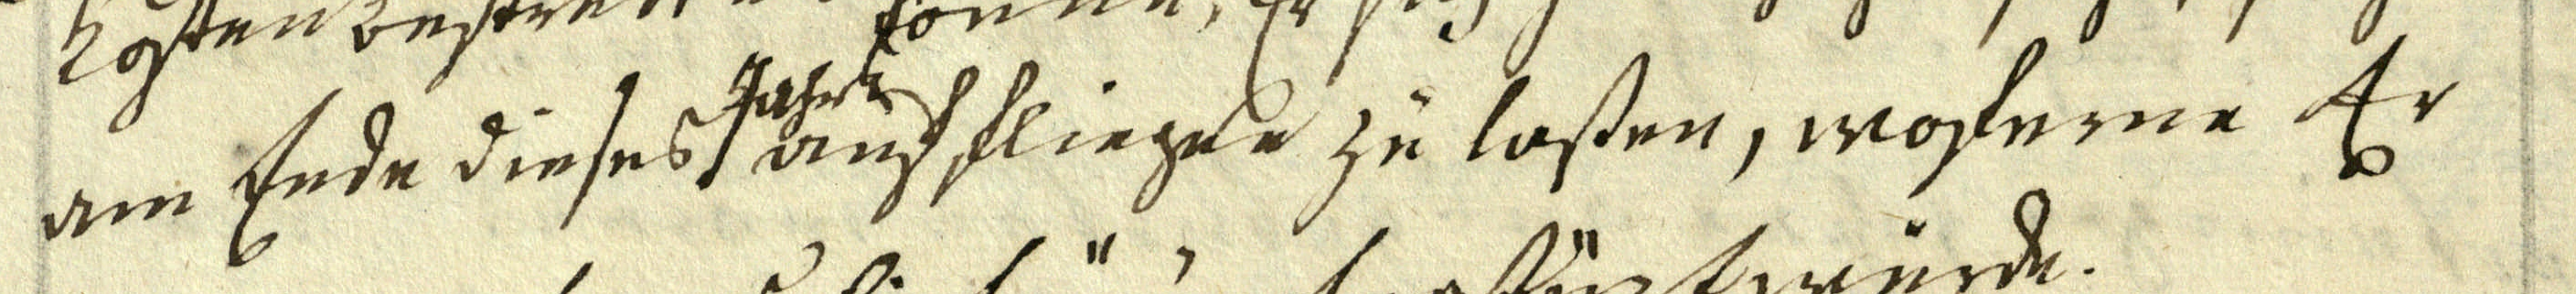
am Ende dieses Jahrs auffliegen zu laßen, woferne Er
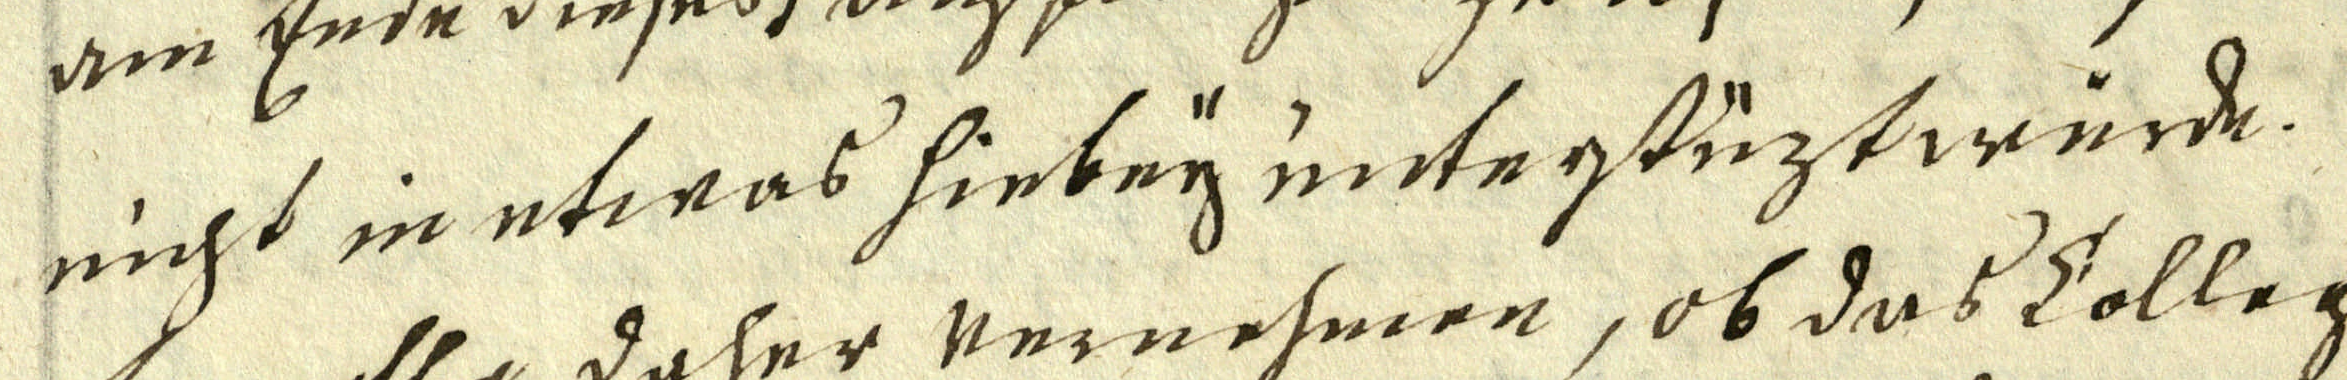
nicht in etwas hiebeÿ unterstüzt würde.
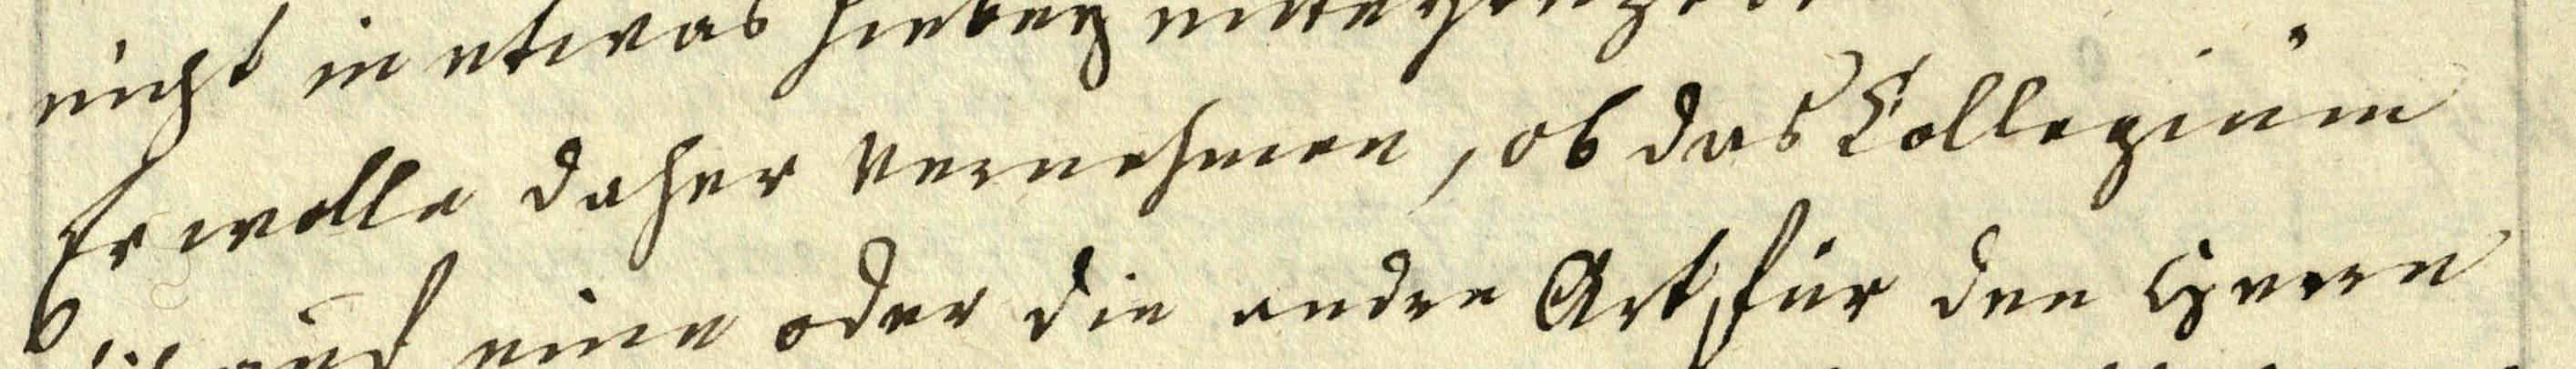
Er wolle daher vernehmen, ob das Collegium
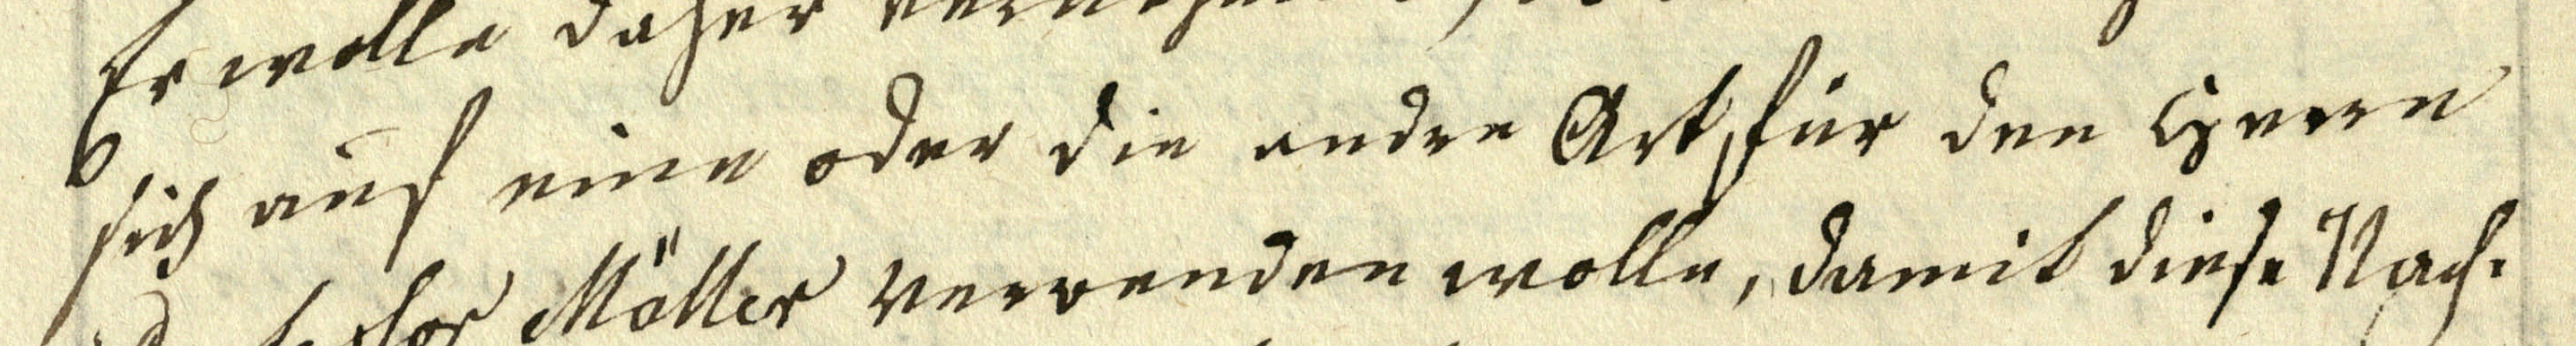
sich auf eine oder die andre Art für den Herrn
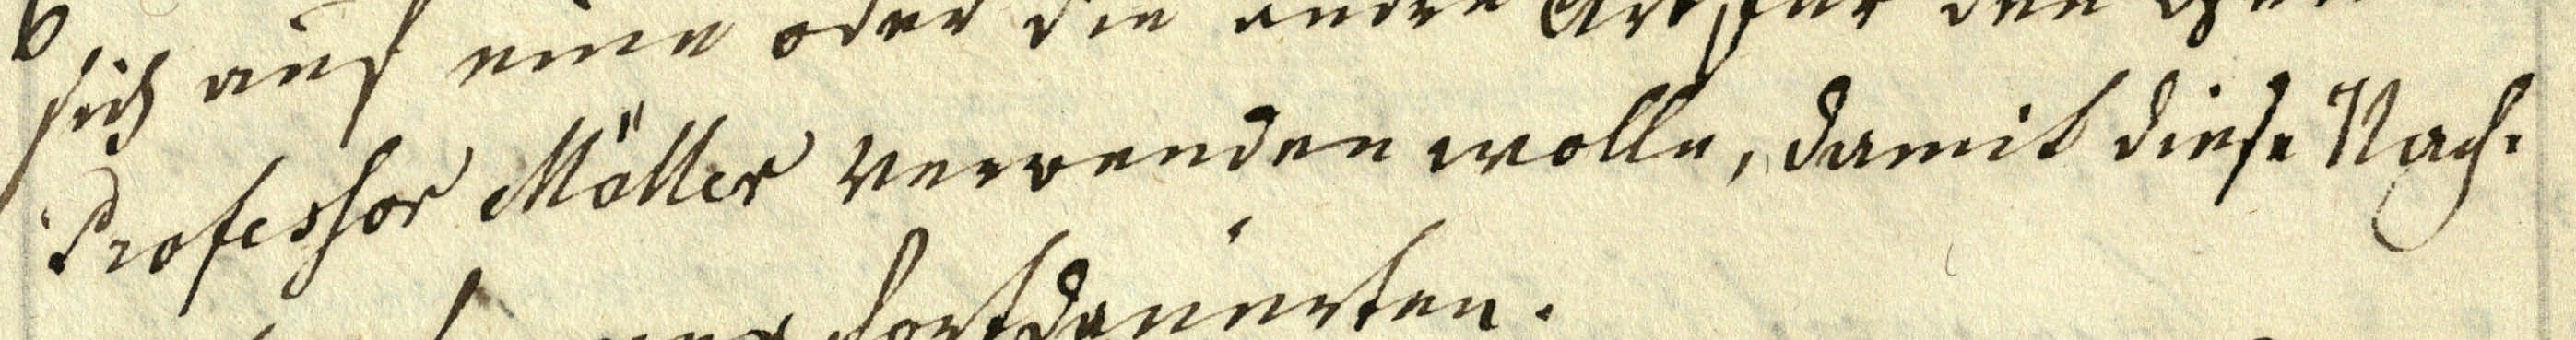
Professor Möller verwenden wolle, damit diese Nach¬
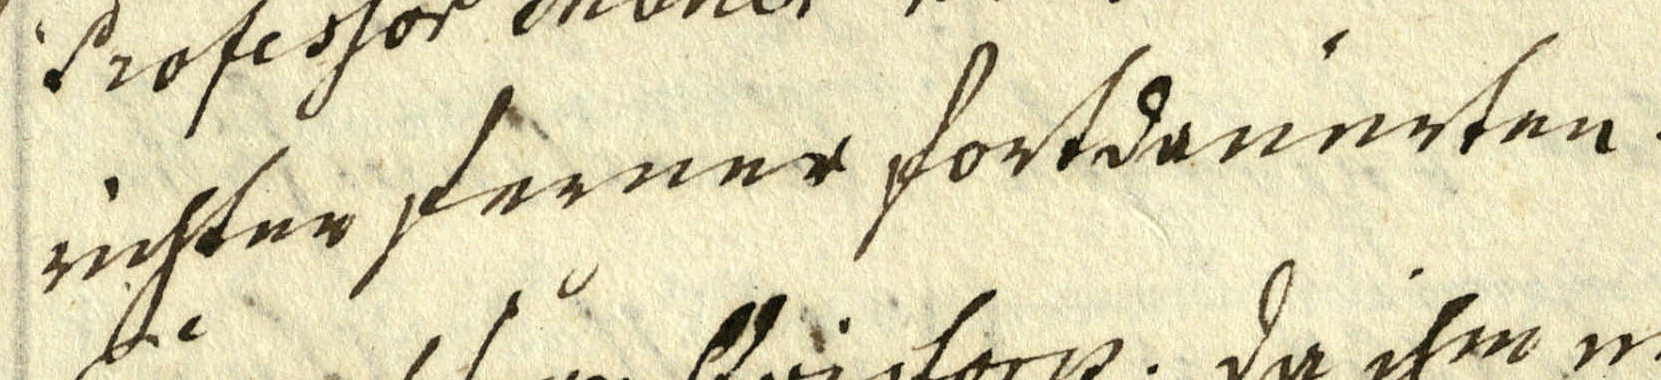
richten ferner fortdauerten.
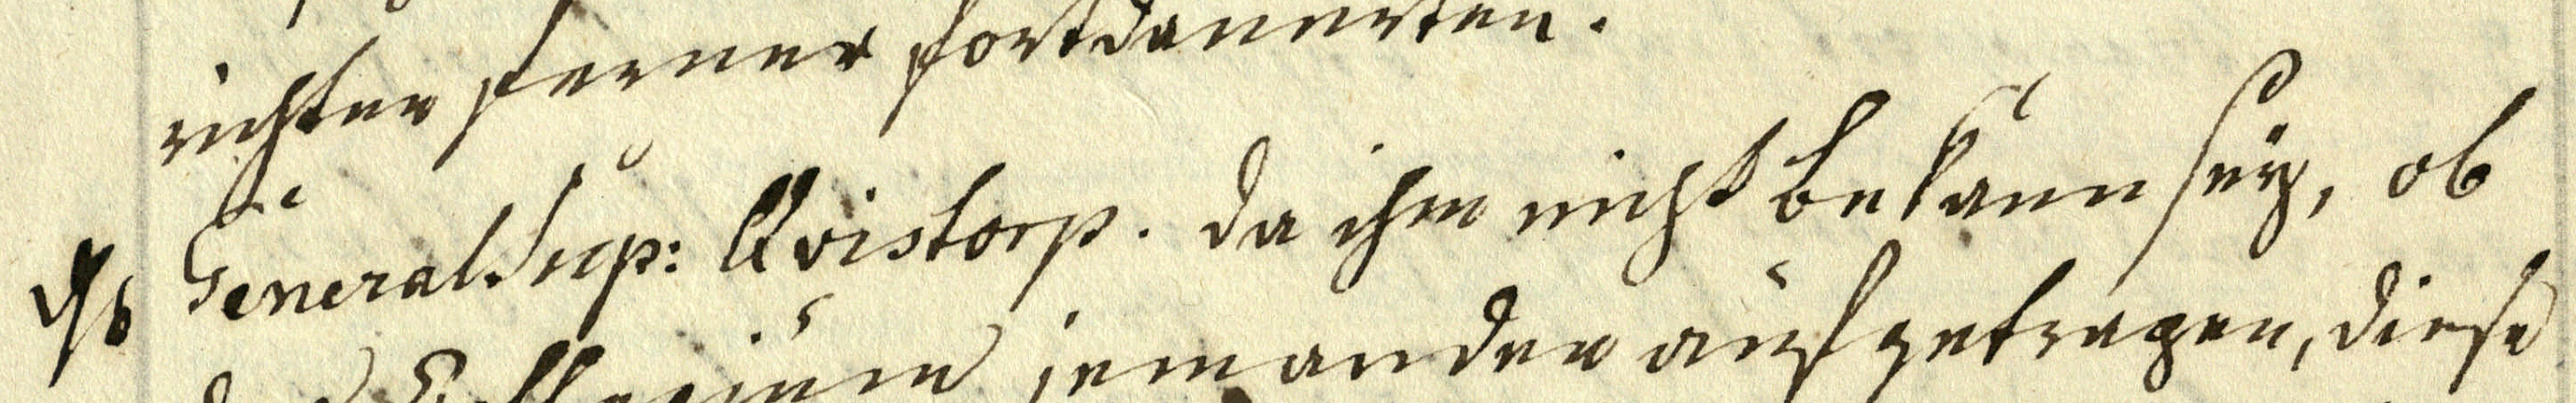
dh GeneralSup. Quistorp. Da ihm nicht bekann seÿ, ob
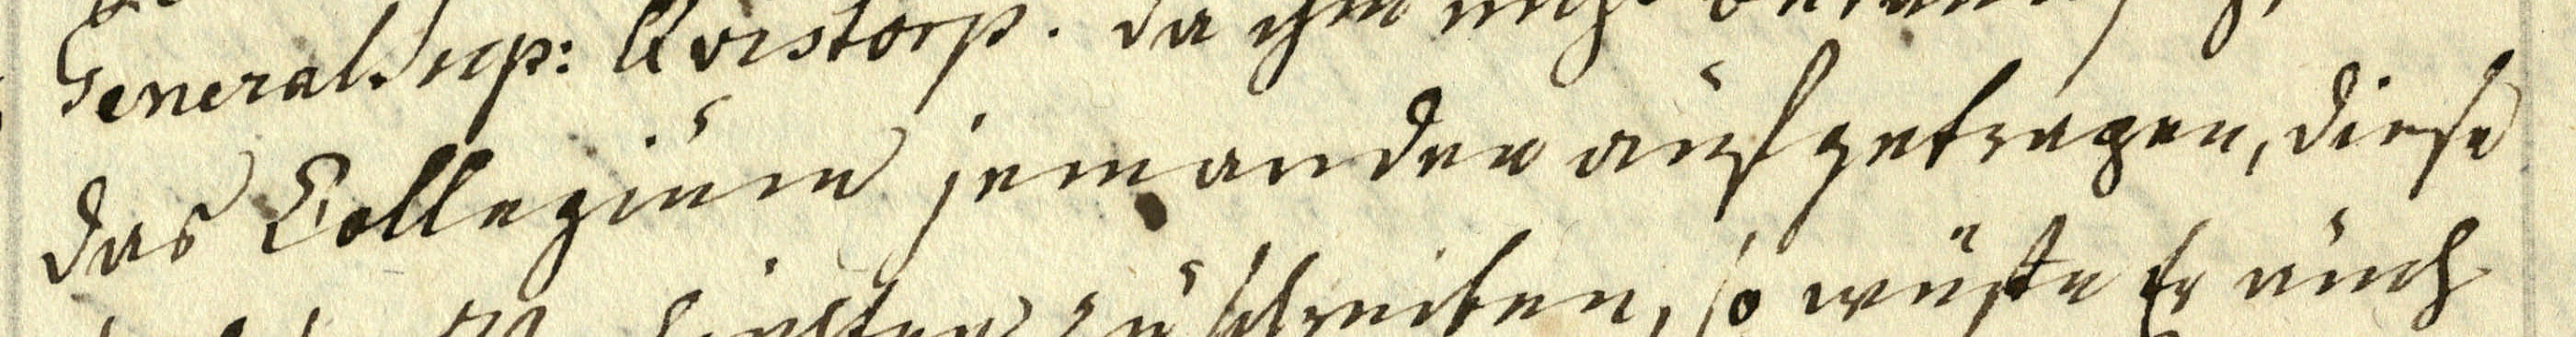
das Collegium jemanden auf getragen, diese
